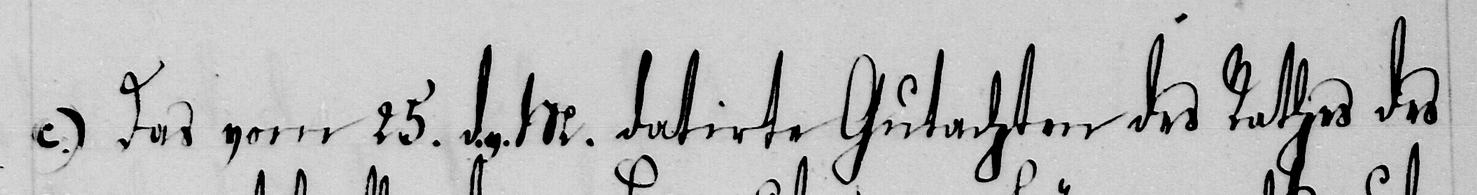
c.) Das vom 25. d. v. M. datirte Gutachten des Rathes des
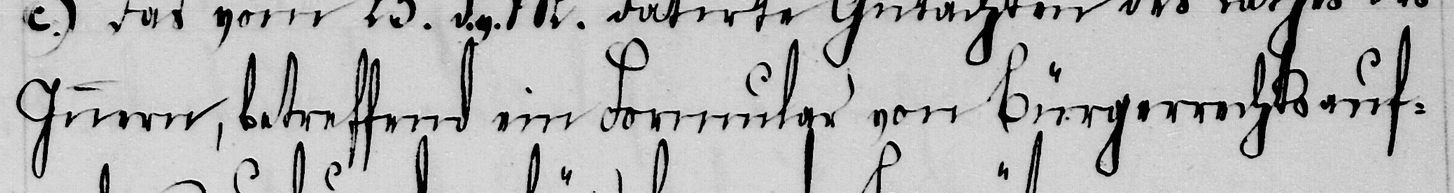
Innern, betreffend ein Formular von Bürgerrechtsauf¬
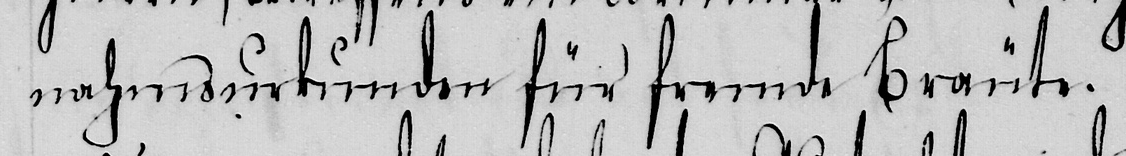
nahmsurkunden für fremde Bräute.
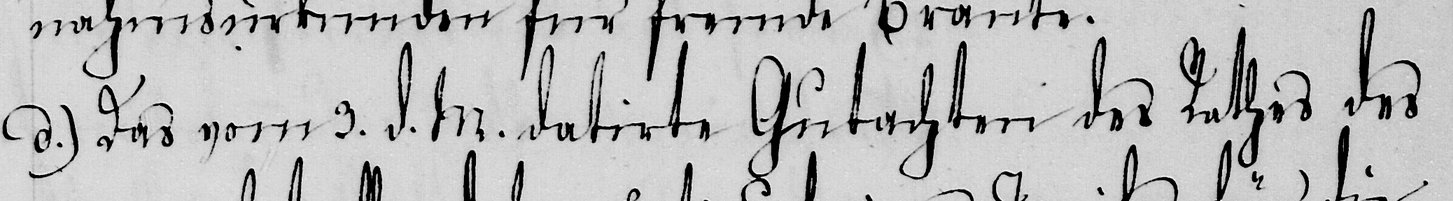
d.) Das vom 3. d. M. datirte Gutachten des Rathes des
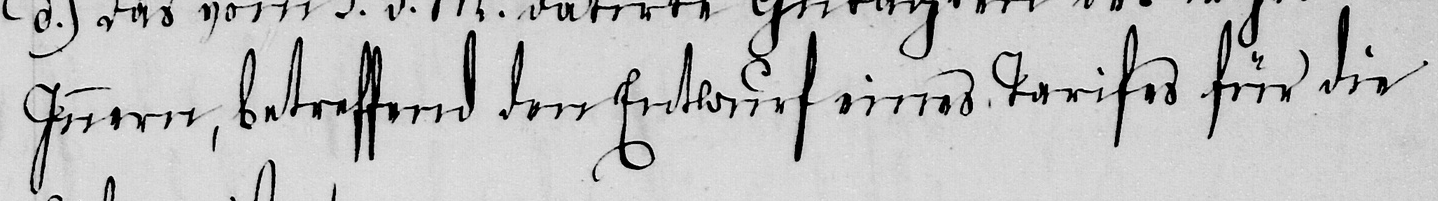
Innern, betreffend den Entwurf eines Tarifes für die
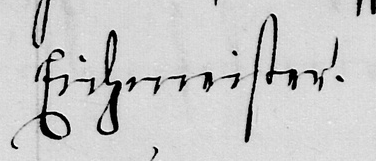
Eichmeister.
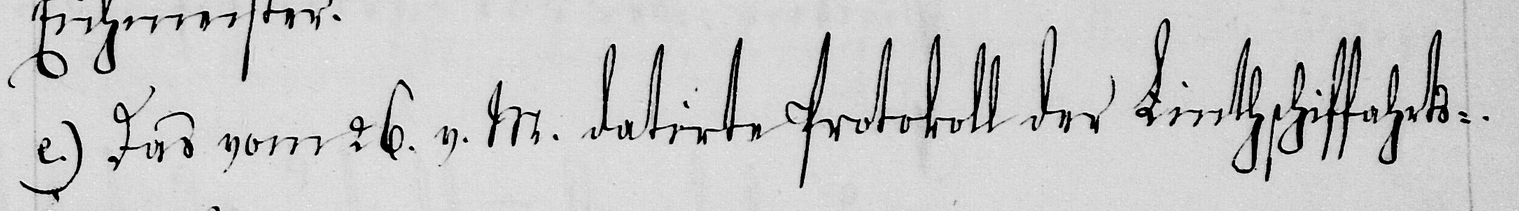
e.) Das vom 26. v. M. datirte Protokoll der Linthschiffahrt¬
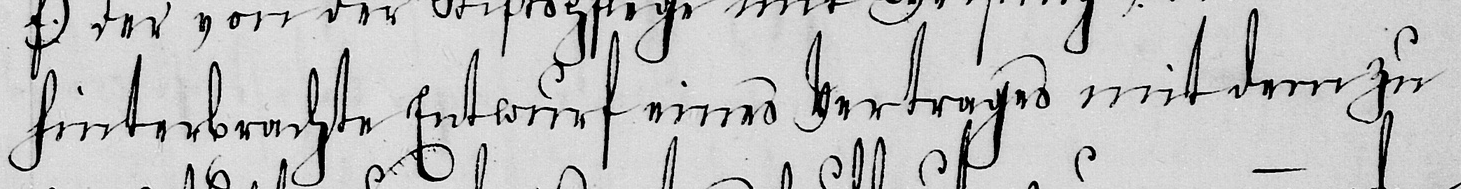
hinterbrachte Entwurf eines Vertrages mit dem zu
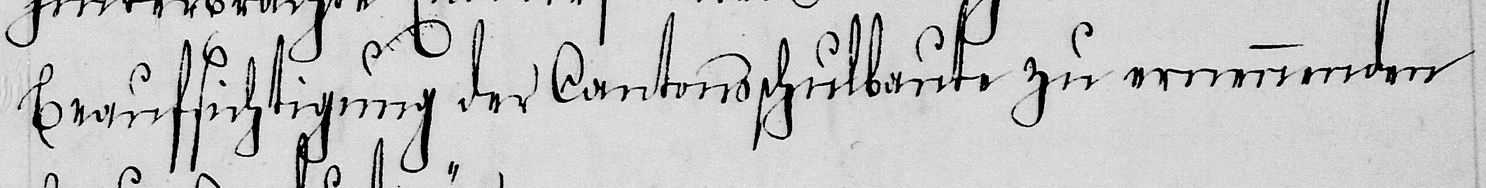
Beaufsichtigung der Cantonsschulbaute zu ernennenden
